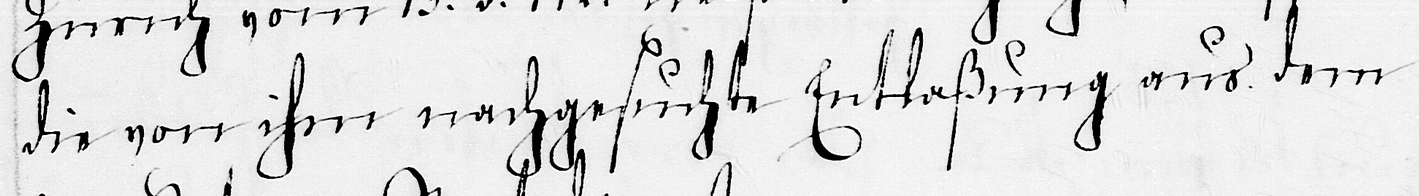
die von ihm nachgesuchte Entlaßung aus dem
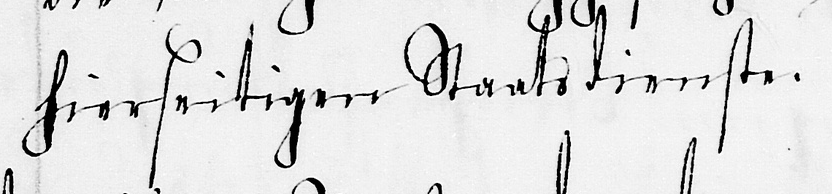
hierseitigen Staatsdienste.
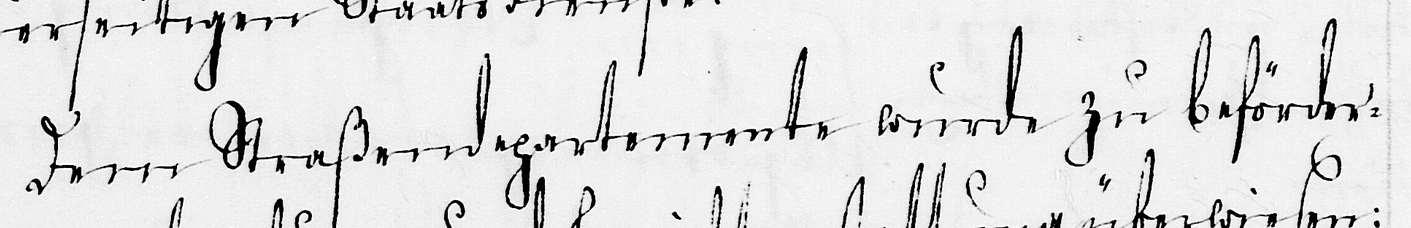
Dem Straßendepartemente wurde zu beförder¬
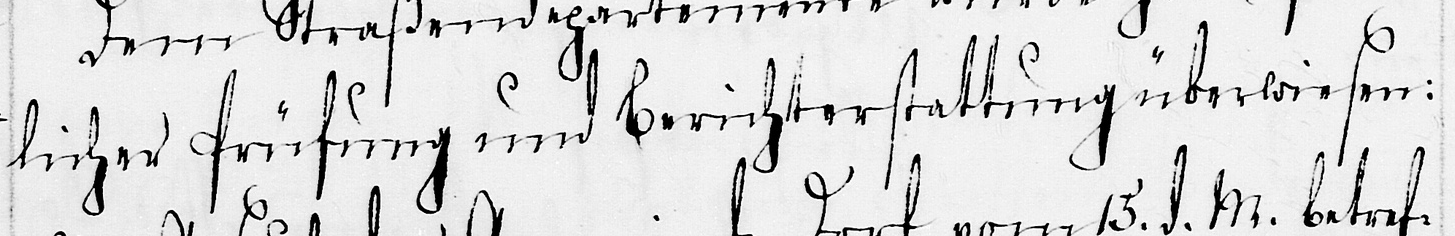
licher Prüfung und Berichterstattung überwiesen:
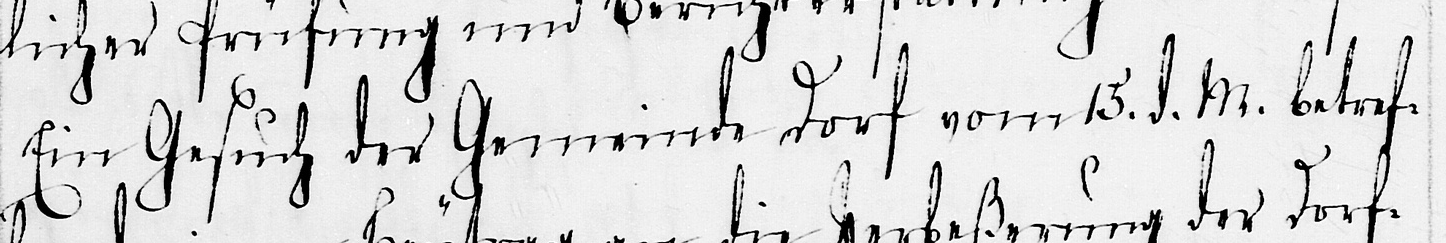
Ein Gesuch der Gemeinde Dorf vom 15. d. M. betref¬
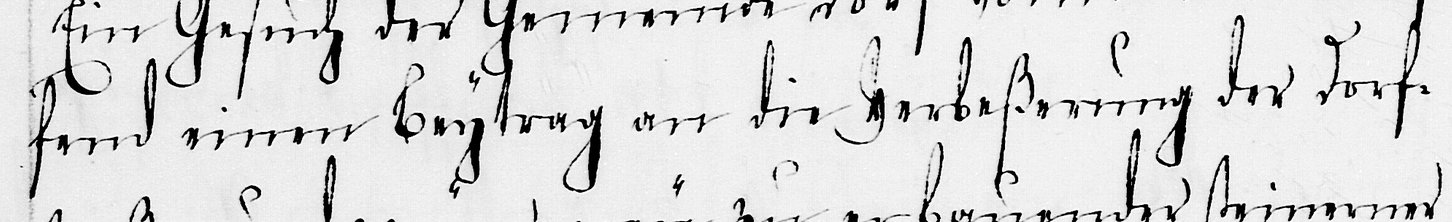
fend einen Beytrag an die Verbeßerung der Dorf¬
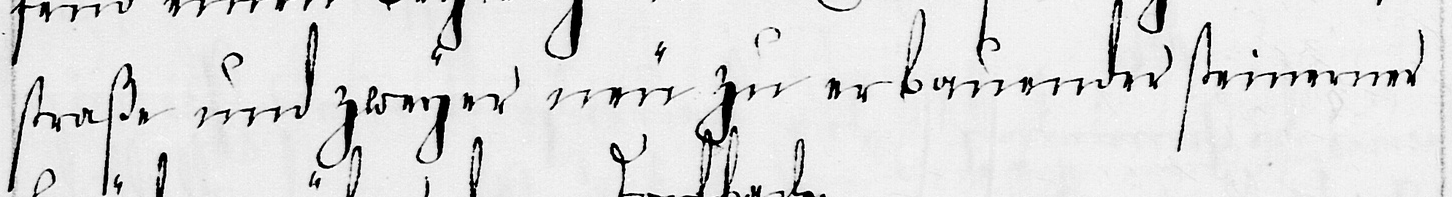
straße und zweyer neu zu erbauender steinerner
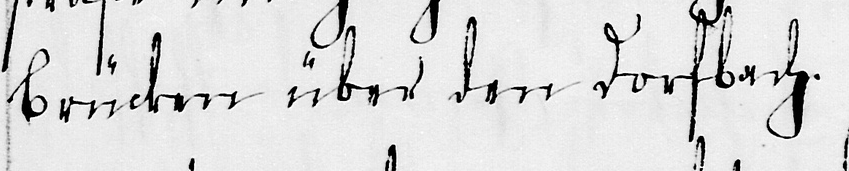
Brücken über den Dorfbach.
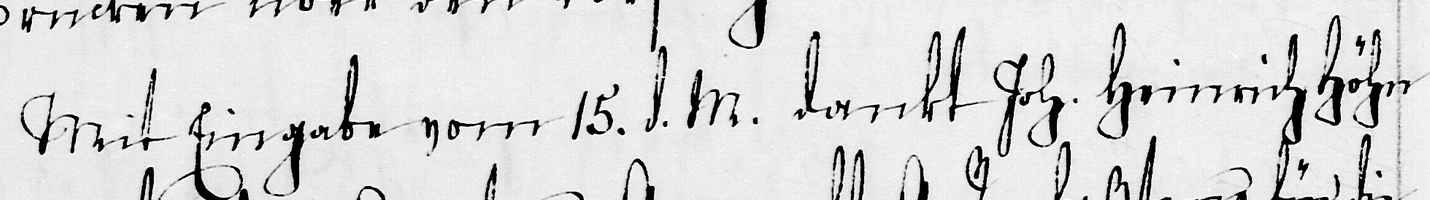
Mit Eingabe vom 15. d. M. dankt Joh. Heinrich Höhn
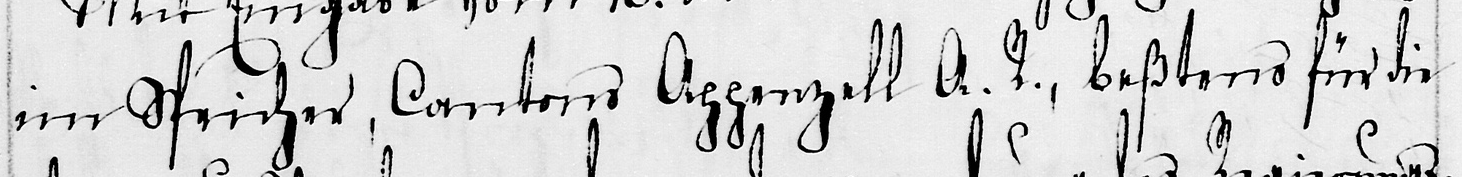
im Speicher, Cantons Appenzell A. R., beßtens für die
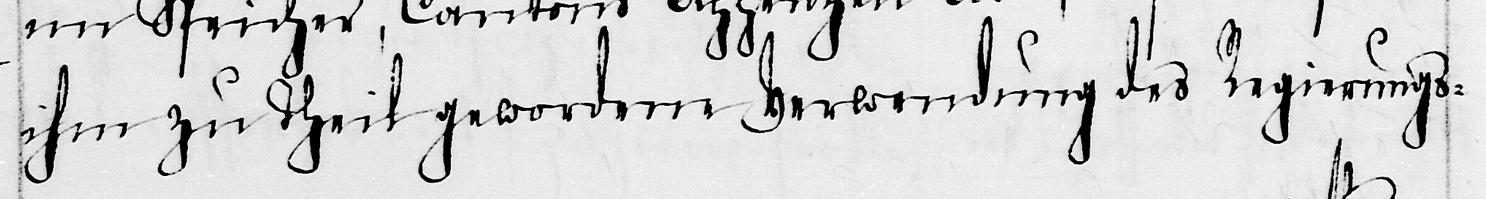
ihm zu Theil gewordene Verwendung des Regierungs-
